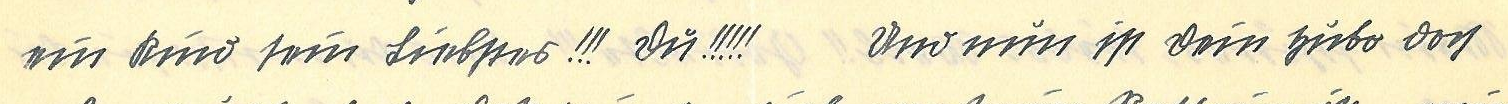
ein Kind sei Liebstes!!! Du!!!!! Und nun ist Dein Hubo doch
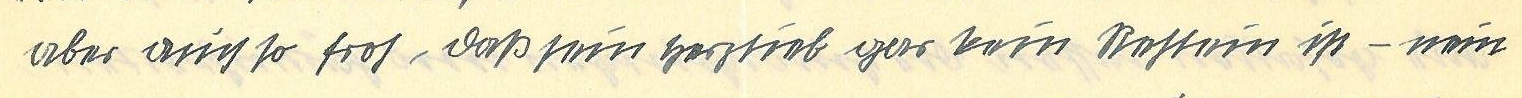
aber so froh, daß sein Herzlieb gar kein Rehlein ist – nein
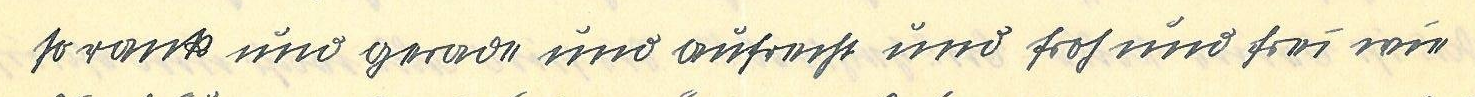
so rank und gerade und aufrecht und froh und frei wie
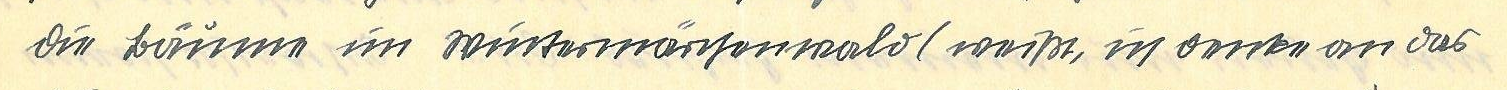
die Bäume im Wintermärchenwald (weißt, ich denke an das
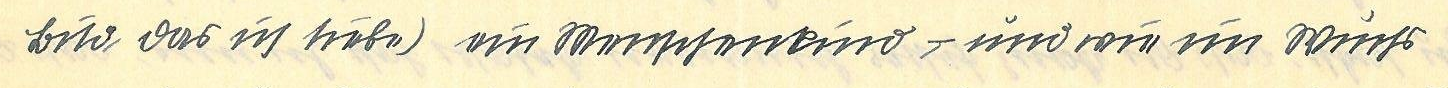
Bild, das ich habe) ein Menschenkind, – und wie im Wuchs
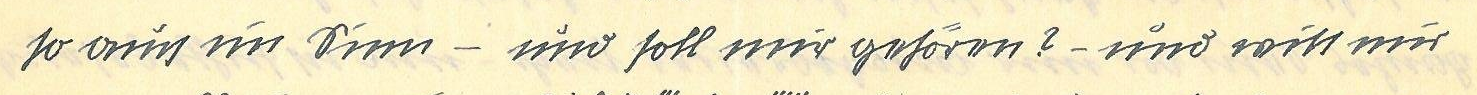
so auch im Sinn – und soll mir gehören? – und will mir
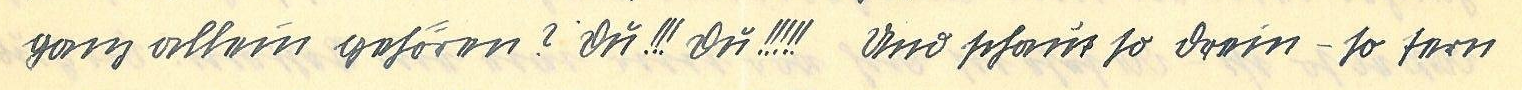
ganz allein gehören? Du!!! Du!!!!! Und schaust so drein – so fern
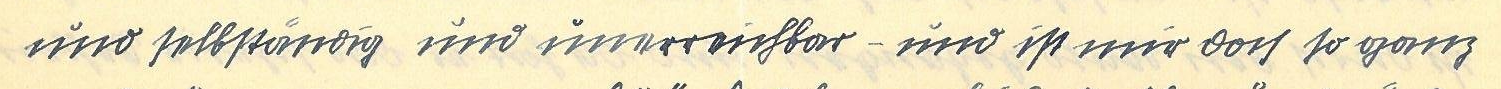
und selbständig und unerreichbar – und ist mir doch so ganz
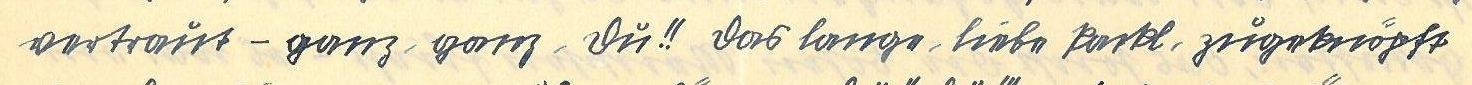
vertraut – ganz, ganz, Du!! Das lange, liebe Packl, zugeknöpft
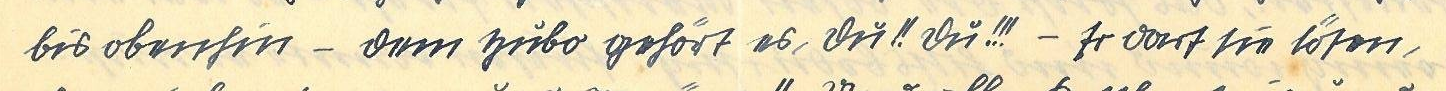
bis obenhin – dem Hubo gehört es, Du!! Du!!! – Er darf sie lösen,
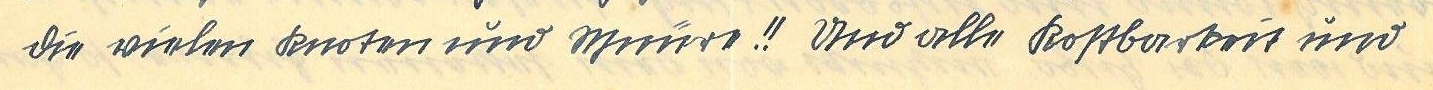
die vielen Knoten und Schnüre!! Und alle Kostbarkeit und
